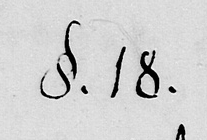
§. 18.
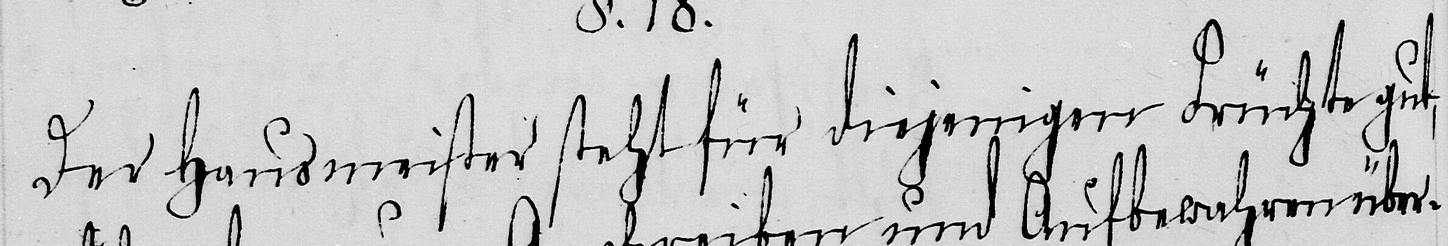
Der Hausmeister steht für diejenigen Früchte gut,
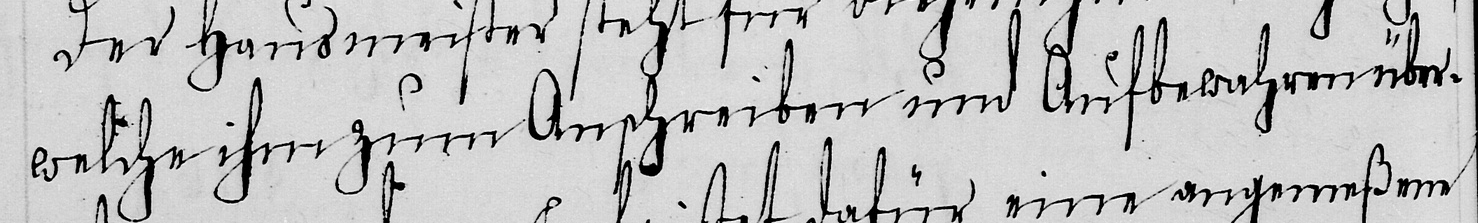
welche ihm zum Anschreiben und Aufbewahren über¬
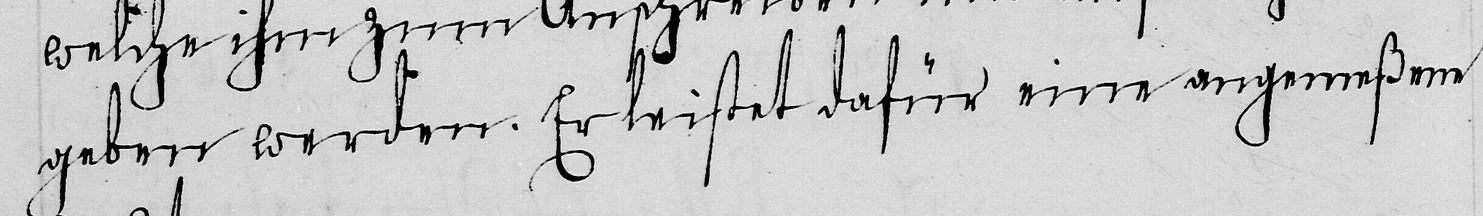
geben werden. Er leistet dafür eine angemeßene
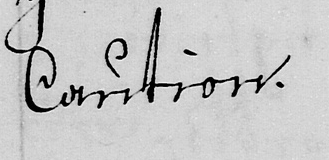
Caution.
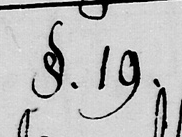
§. 19.
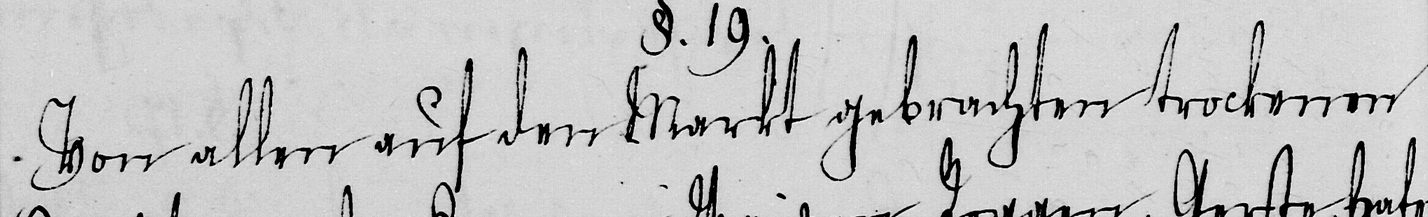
Von allen auf den Markt gebrachten trockenen
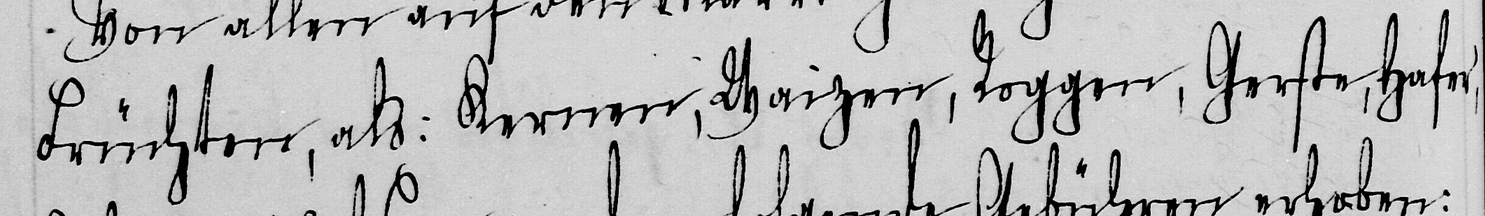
Früchten, als: Kernen, Waizen, Roggen, Gerste, Hafe¬
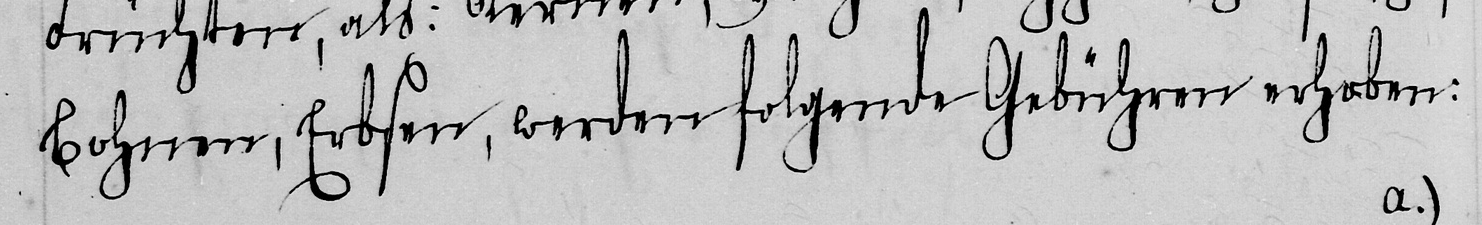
Bohnen, Erbsen, werden folgende Gebühren erhoben:
